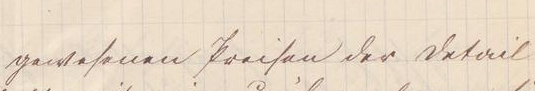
gewesenen Preisen der Detail-
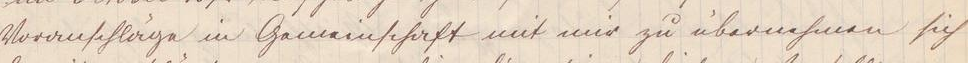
Voranschläge in Gemeinschaft mit mir zu übernehmen sich
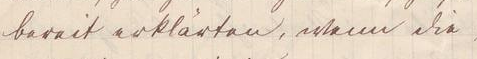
bereit erklärten, wenn die
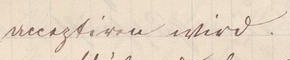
acceptiren wird.
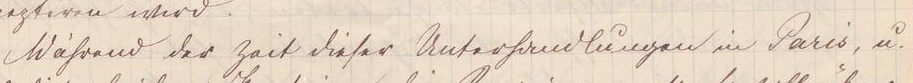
Während der Zeit dieser Unterhandlungen in Paris, u.
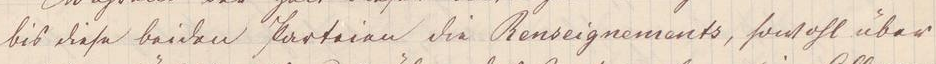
bis diese beiden Parteien die Renseignements, sowohl über
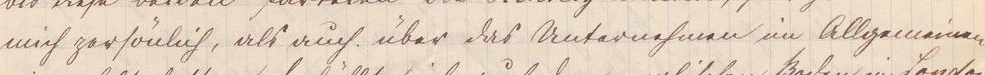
mich persönlich, als auch über das Unternehmen im Allgemeinen
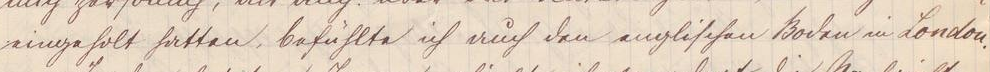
eingeholt hatten, befühlte ich auch den englischen Boden in London.
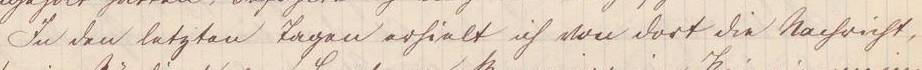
In den letzten Tagen erhielt ich von dort die Nachricht,
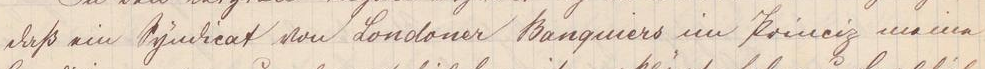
daß ein Syndicat von Londoner Banquiers im Princip meine
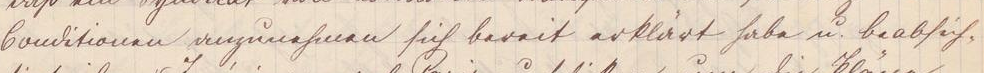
Conditionen anzunehmen sich bereit erklärt habe u. beabsich-
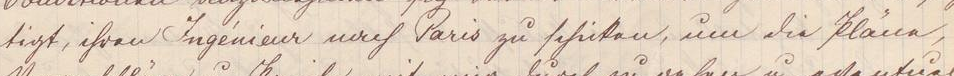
tigt, ihren Ingénieur nach Paris zu schicken, um die Pläne,
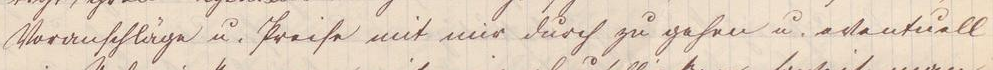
Voranschläge u. Preise mit mir durch zu gehen u. eventuell
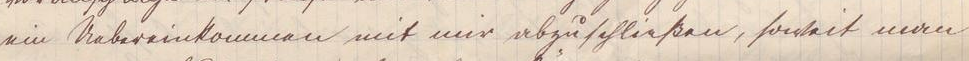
ein Uebereinkommen mit mir abzuschließen, soweit man
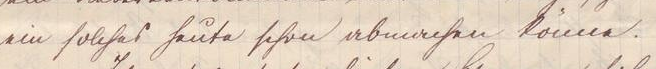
ein solches heute schon abmachen könne.
